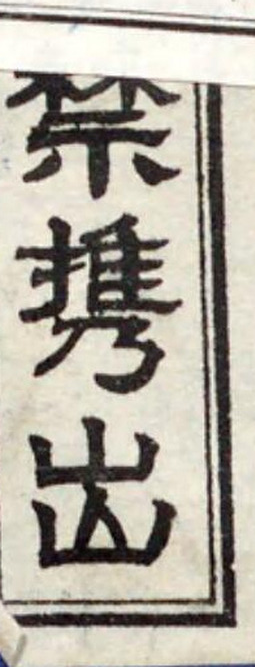禁携出

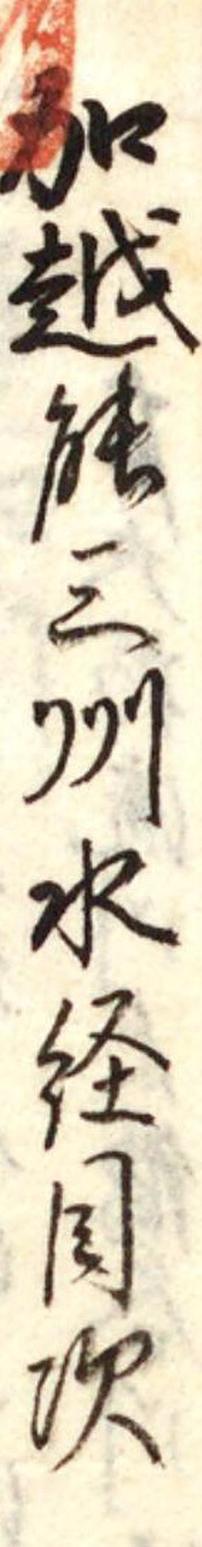加越能三州水経目次
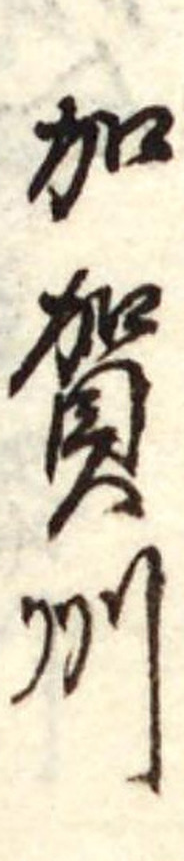加賀州
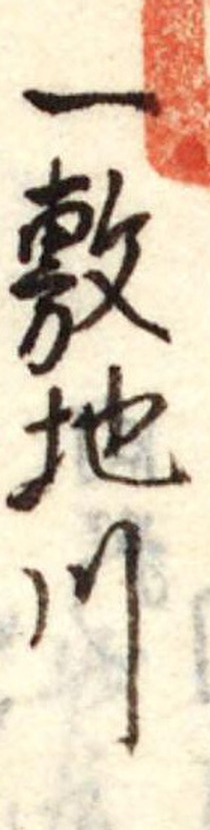一敷地川
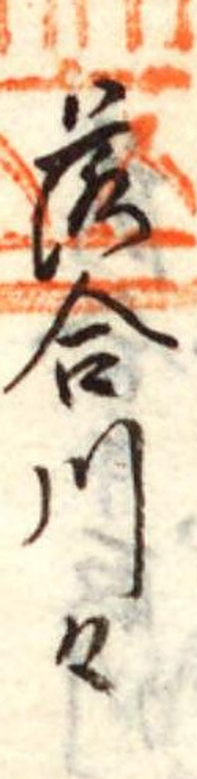落合川々
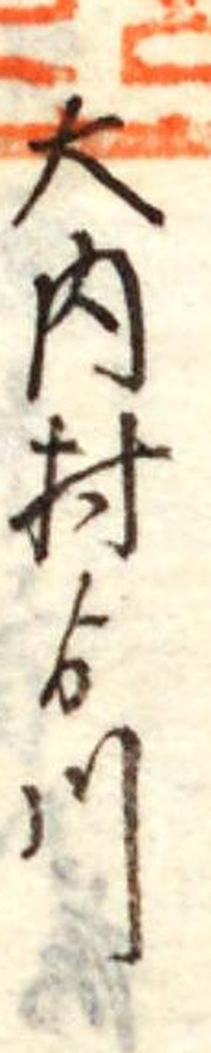大内村ゟ川
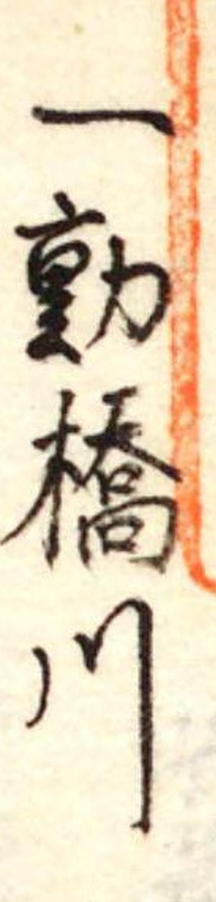一動橋川
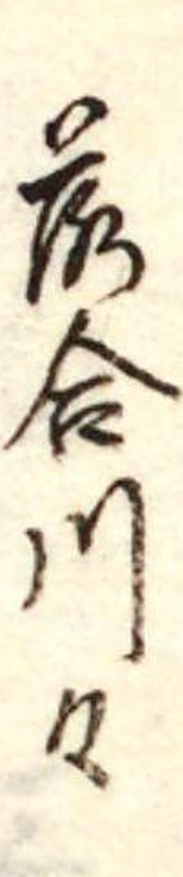落合川々
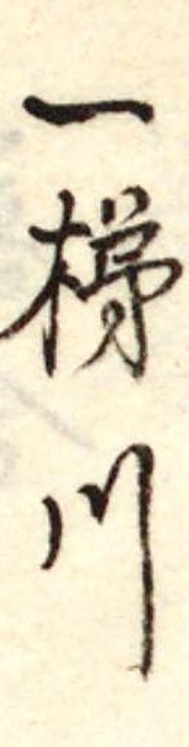一梯川
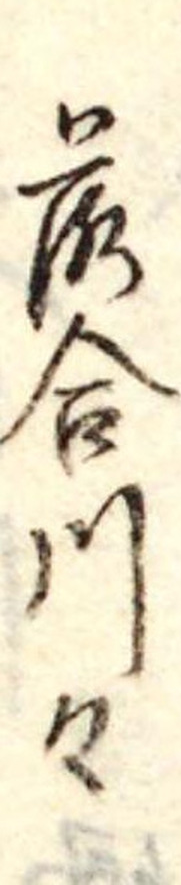落合川々
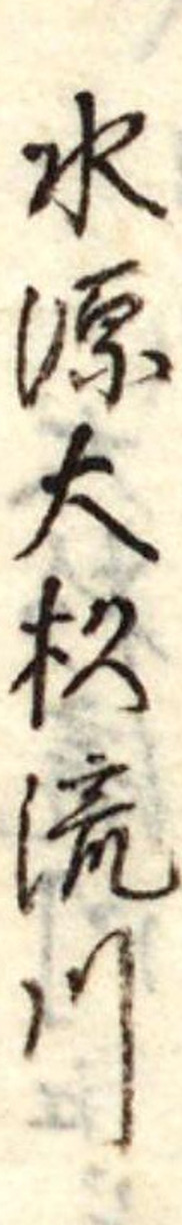水源大杦流川

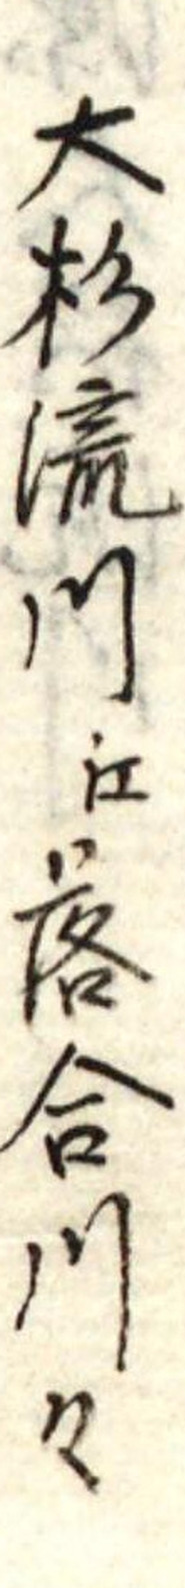大杉流川江落合川々
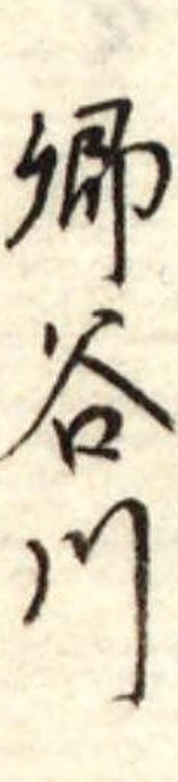郷谷川
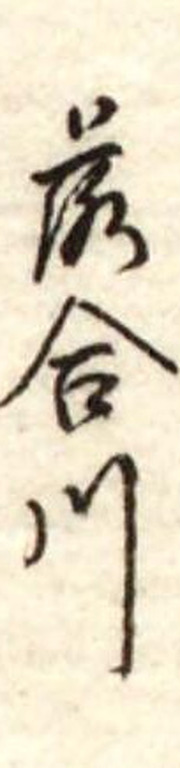落合川
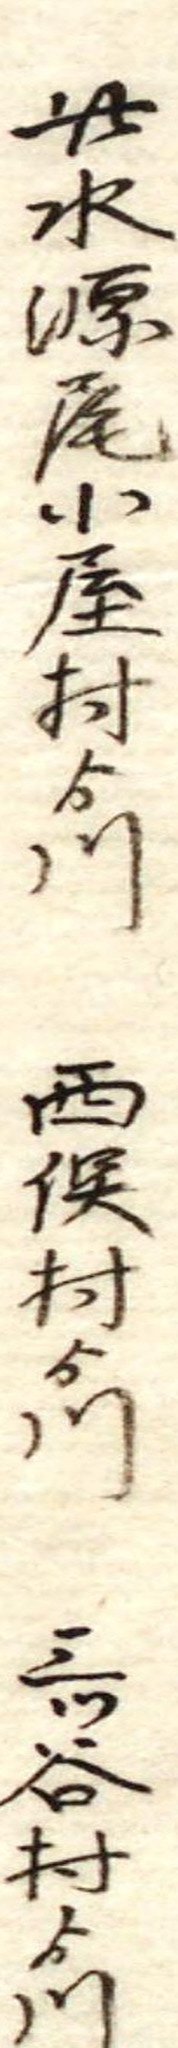此水源尾小屋村ゟ川西俣村ゟ川三ッ谷村ゟ川
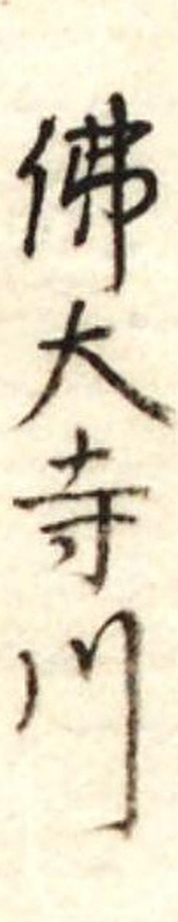佛大寺川
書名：増補大路水経
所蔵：Ishikawa Prefectural Library
